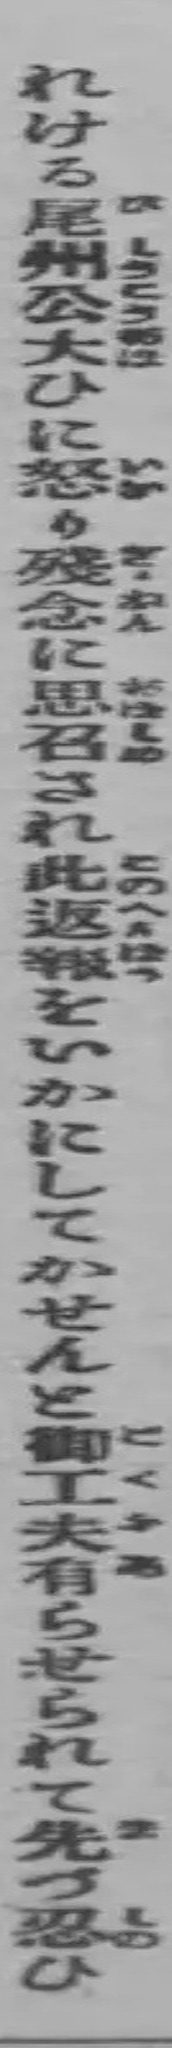れける尾州公大ひに怒り残念に思召され此返報をいかにしてかせんと御工夫有らせられて先づ忍ひ
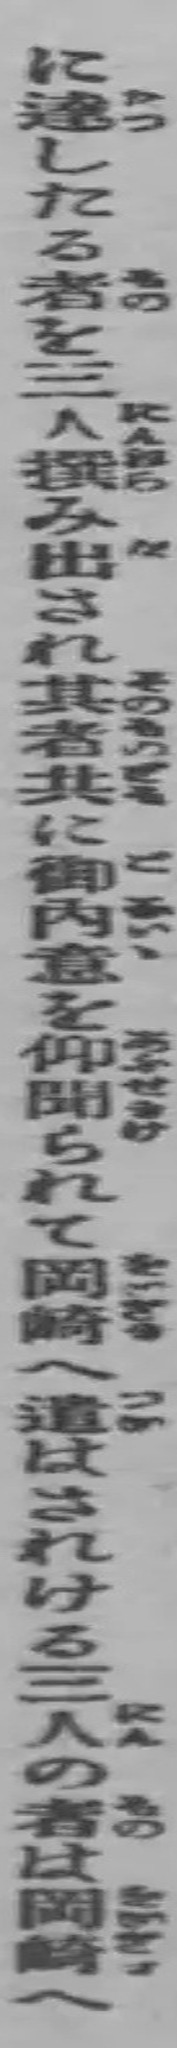に達したる者を三人撰み出され其者共に御内意を仰聞られて岡崎へ遣はされける三人の者は岡崎へ
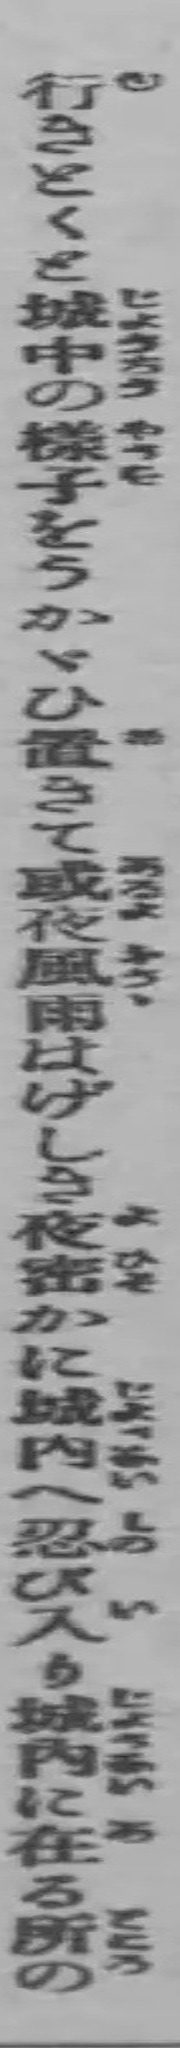行きとくと城中の様子をうかゞひ置きて或夜風雨はげしき夜密かに城内へ忍び入り城内に在る所の
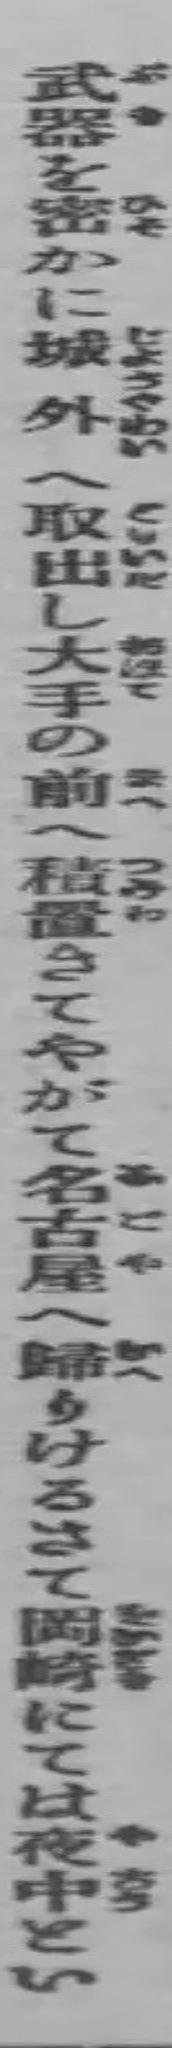武器を密かに城外へ取出し大手の前へ積置きてやがて名古屋へ帰りけるさて岡崎にては夜中とい
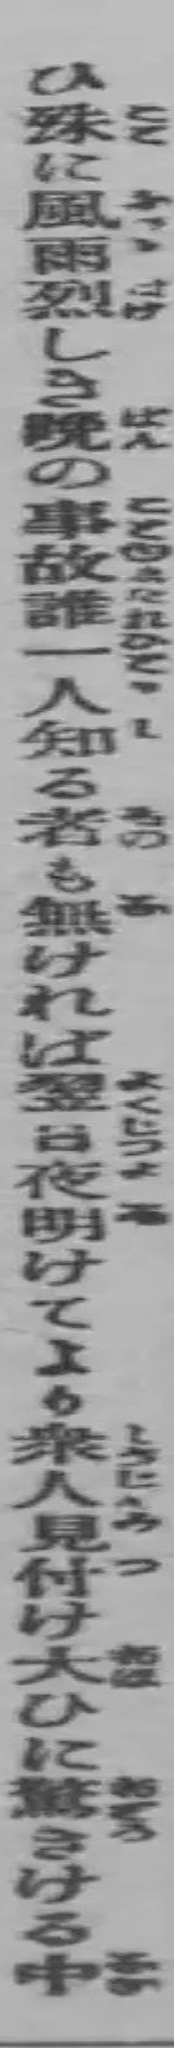ひ殊に風雨烈しき晩の事故誰一人知る者も無ければ翌日夜明けてより衆人見付け大ひに驚きける中
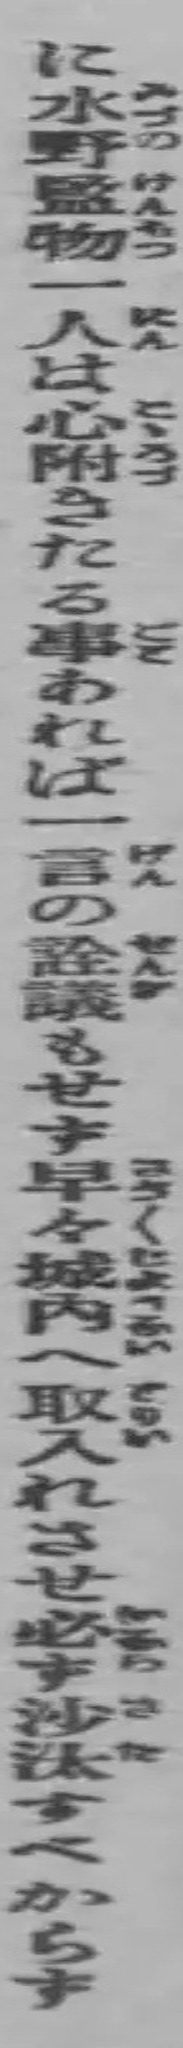に水野監物一人は心附きたる事あれば一言の詮議もせず早々城内へ取入れさせ必ず沙汰すべからず
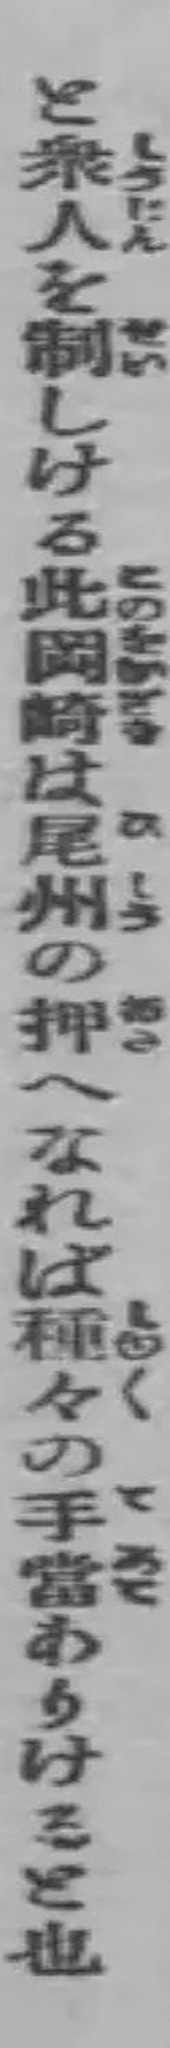と衆人を制しける此岡崎は尾州の押へなれば種々の手当ありけると也
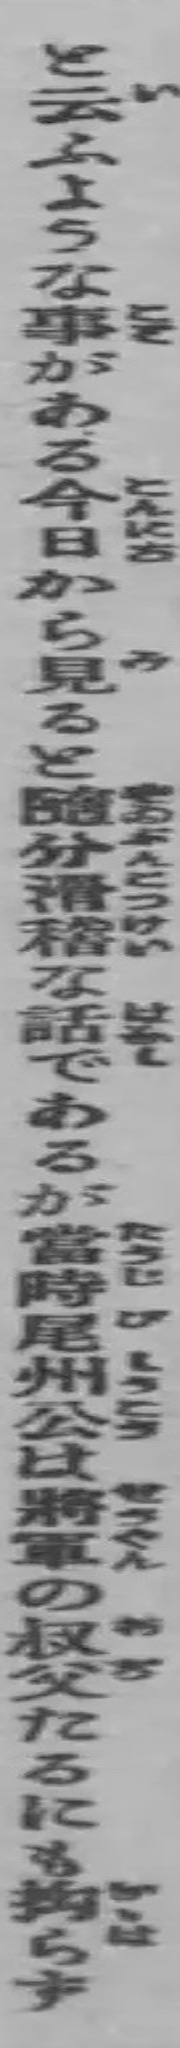と云ふような事がある今日から見ると随分滑稽な話であるが当時尾州公は将軍の叔父たるにも拘らず
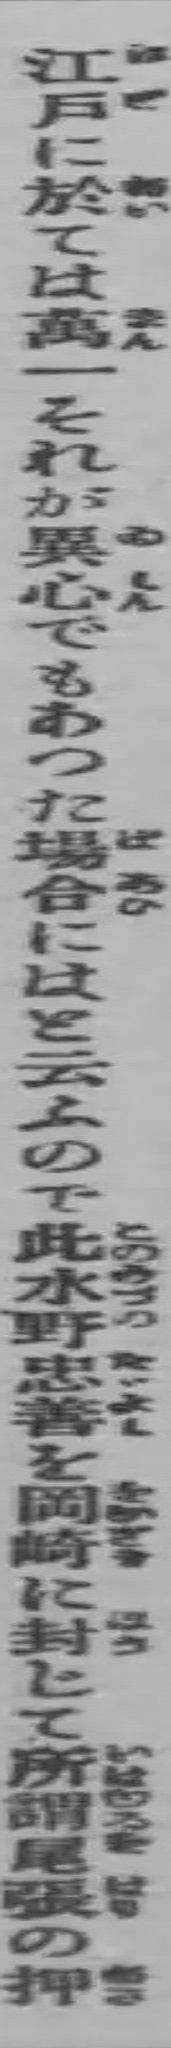江戸に於ては万一それが異心でもあうた場合にはと云ふので此水野忠善を岡崎に封じて所謂尾張の押
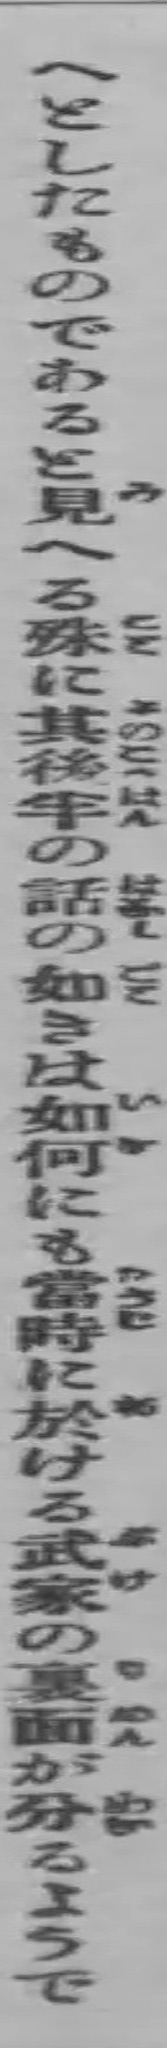へとしたものであると見へる殊に其後半の話の如きは如何にも当時に於ける武家の裏面が分るようで
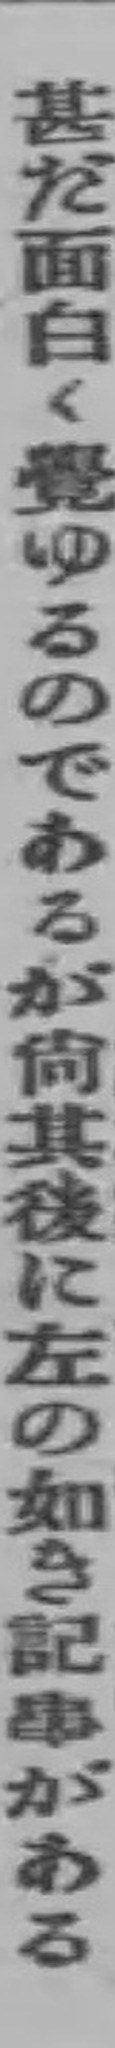甚だ面白く覚ゆるのであるが尚其後に左の如き記事がある
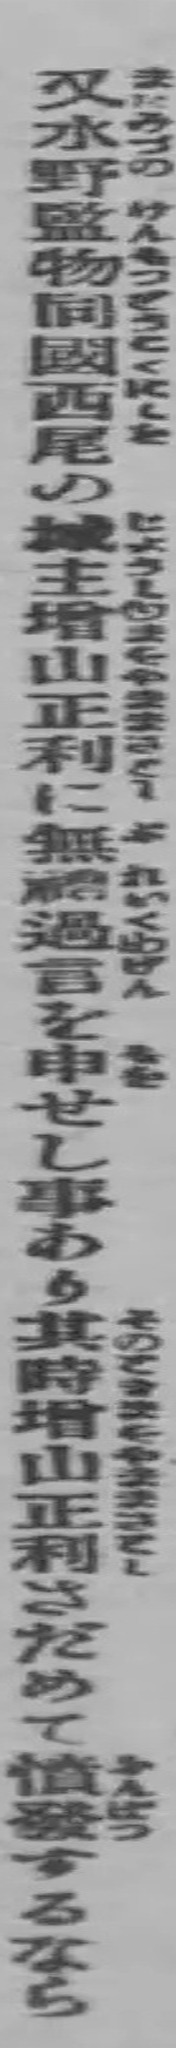又水野監物同国西尾の城主増山正利に無礼過言を申せし事あり其時増山正利さだめて憤発するなら
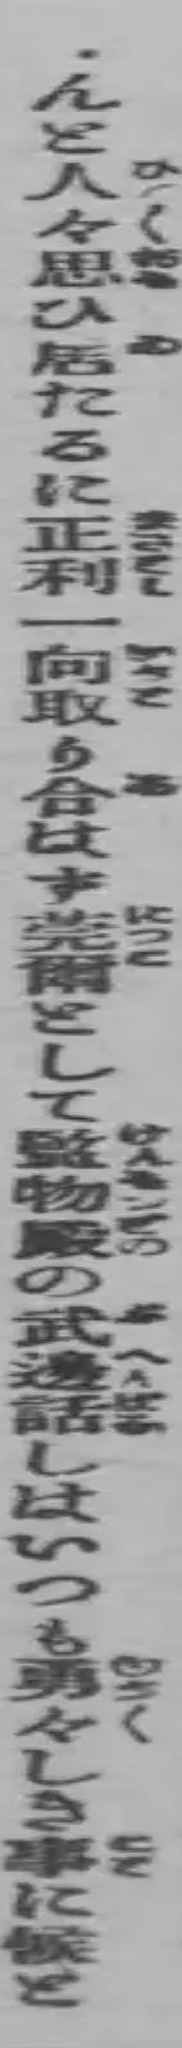んと人々思ひ居たるに正利一向取り合はず莞爾として監物殿の武辺話しはいつも勇々しき事に候と
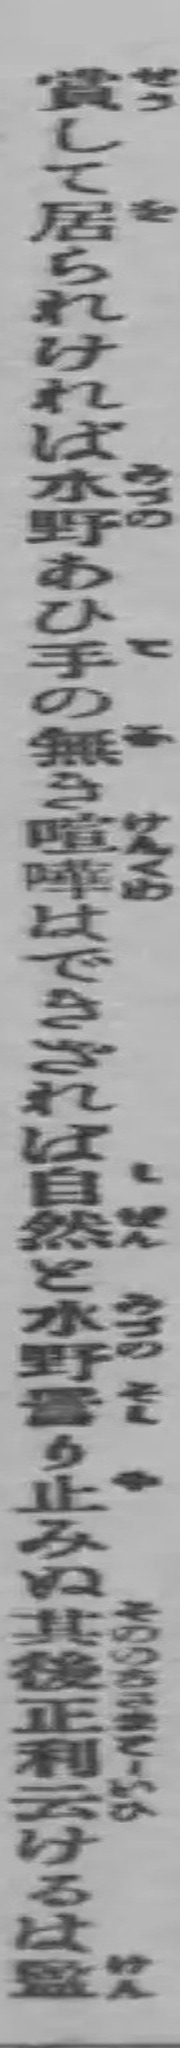賞して居られければ水野あひ手の無き喧嘩はできざれば自然と水野謷り止みぬ其後正利云けるは監
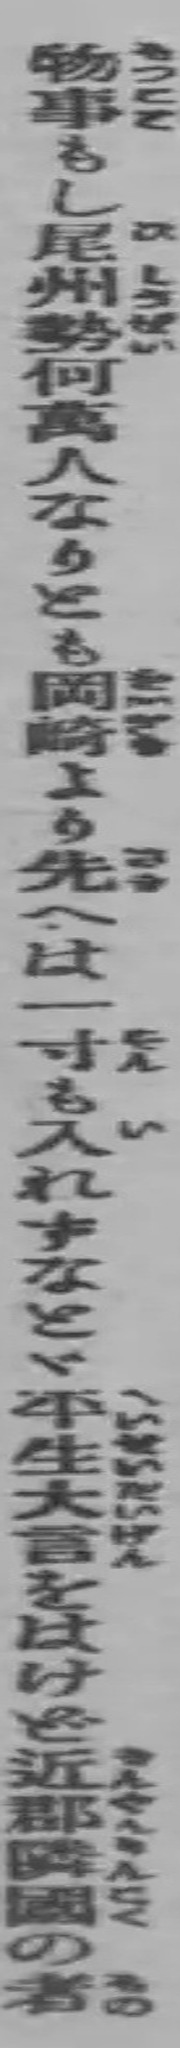物事もし尾州勢何万人なりとも岡崎より先へは一寸も入れずなとゞ平生大言をはけど近郡隣国の者

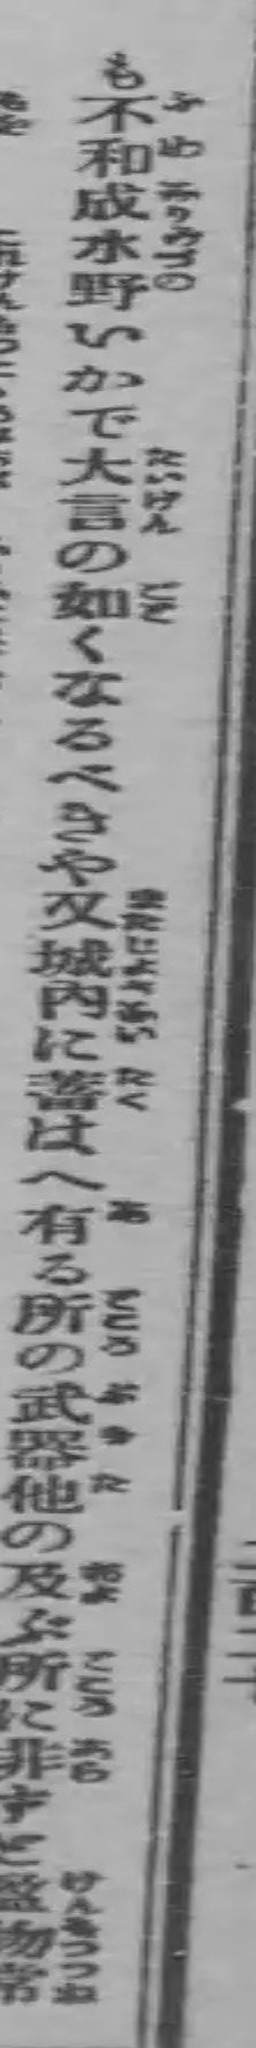も不和成水野いかで大言の如くなるべきや又城内に蓄はへ有る所の武器他の及ぶ所に非ずと監物常
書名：豊橋市史談
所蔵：国立国会図書館 National Diet Library, JAPAN
